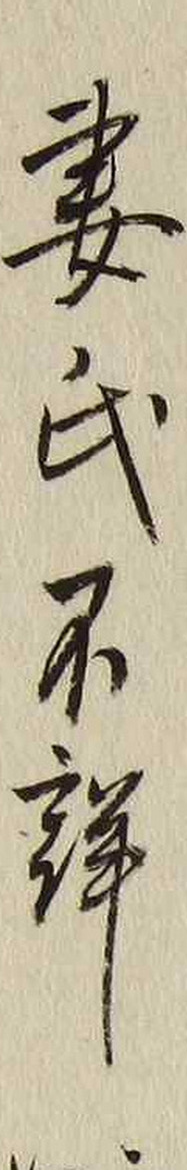母氏不詳
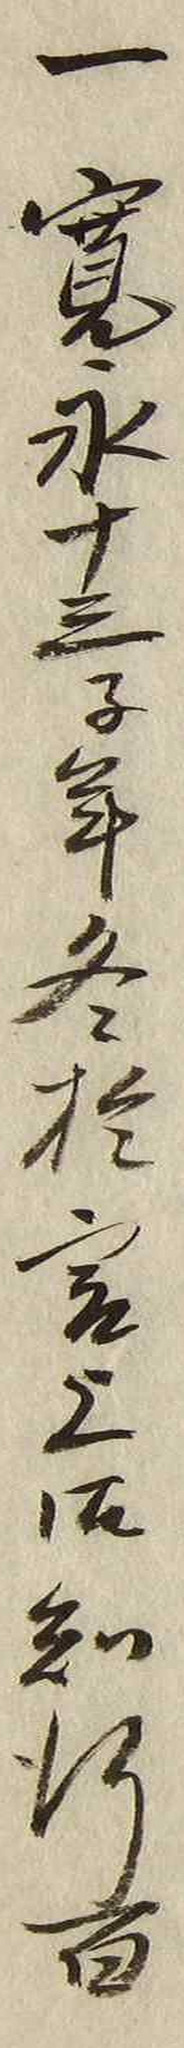一寛永十三子年冬於最上御知行百

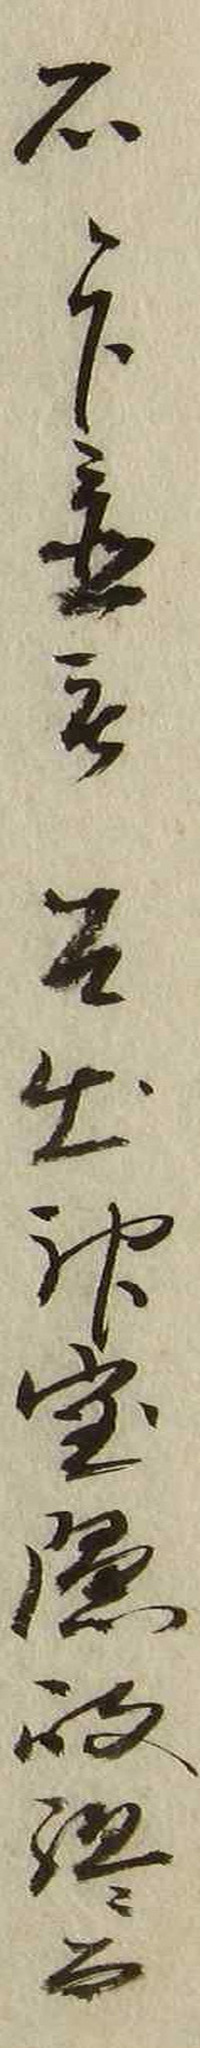石被下置被召出神宝隠岐組ニ而
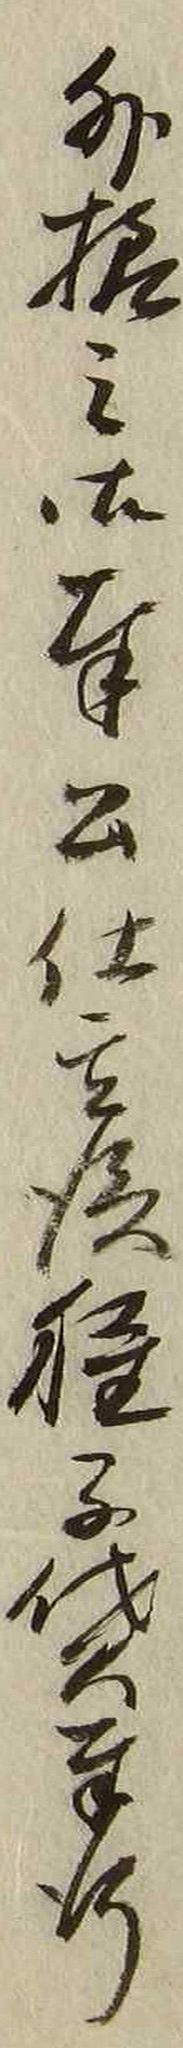外様之御奉公仕其後種子貸奉行
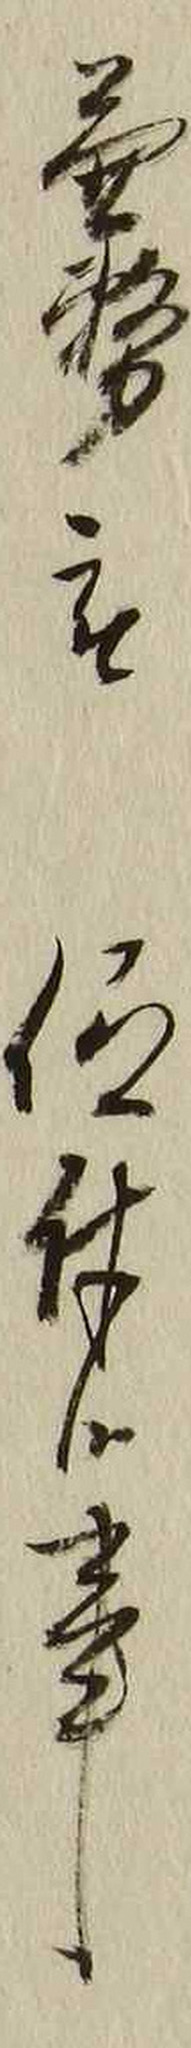兼務被仰付候事
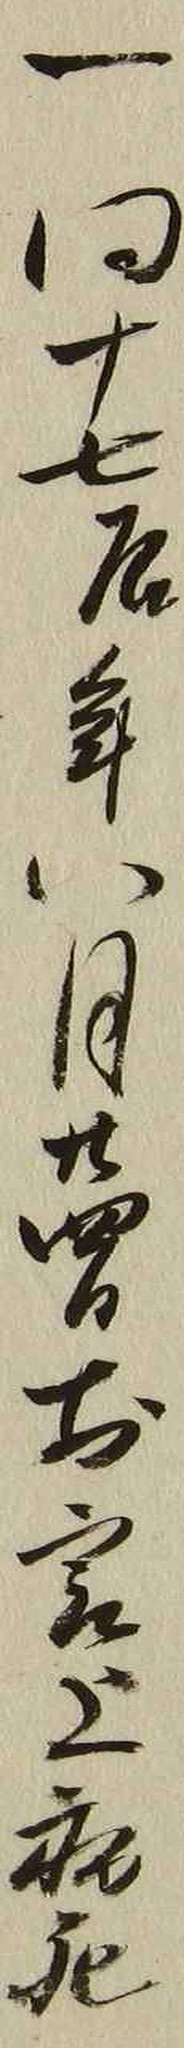一同十七辰年八月廿四日於最上病死
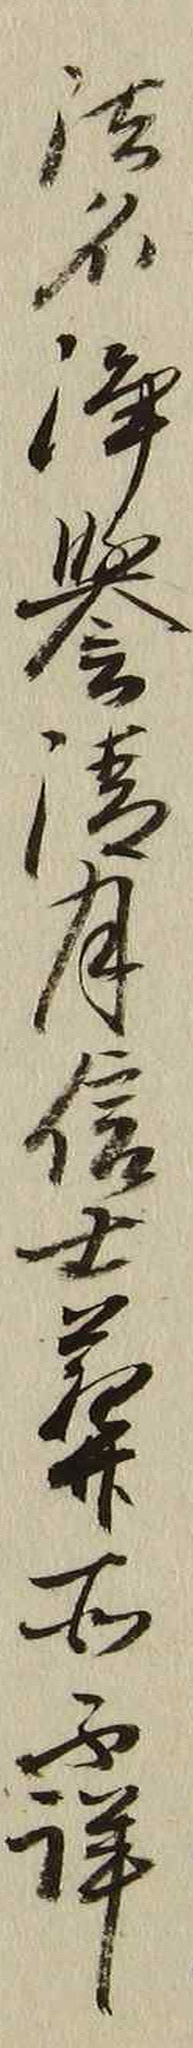法名浄誉清月信士葬所不詳
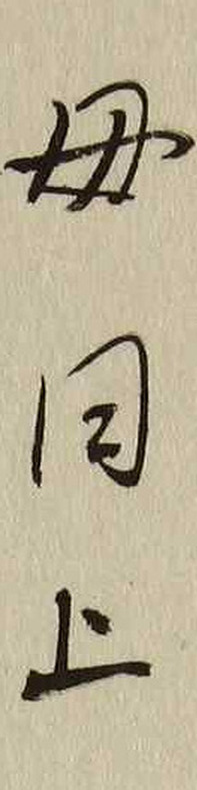母同上
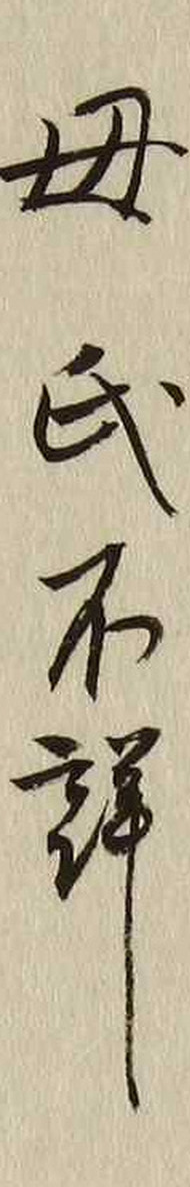母氏不詳
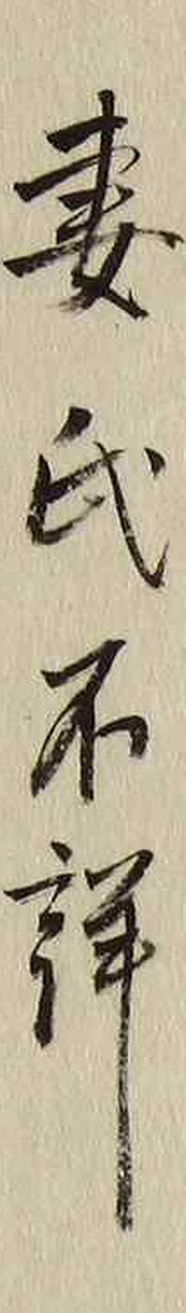妻氏不詳
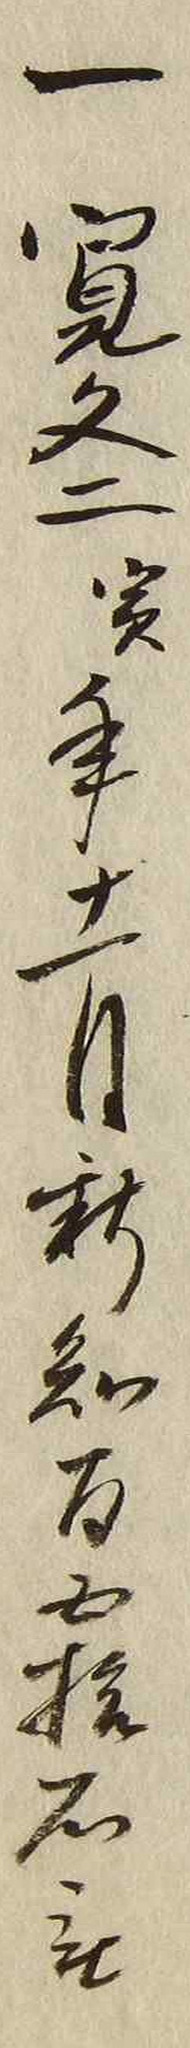一寛文二寅年十一月新知百五十石被

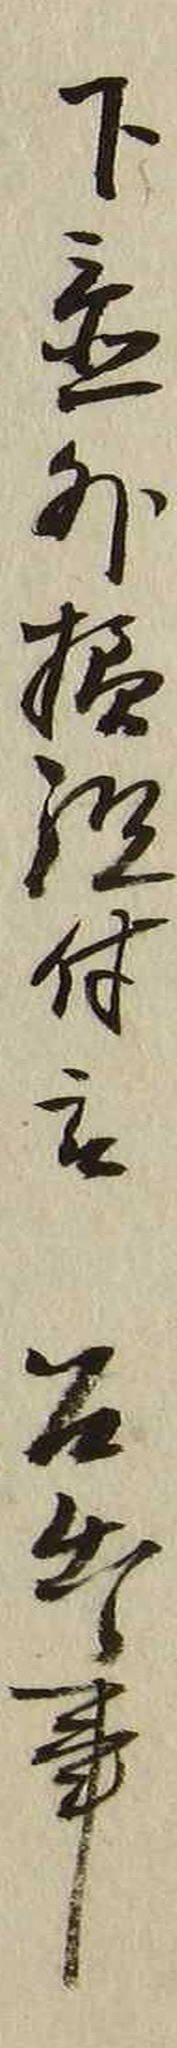下置外様組付被召出候事
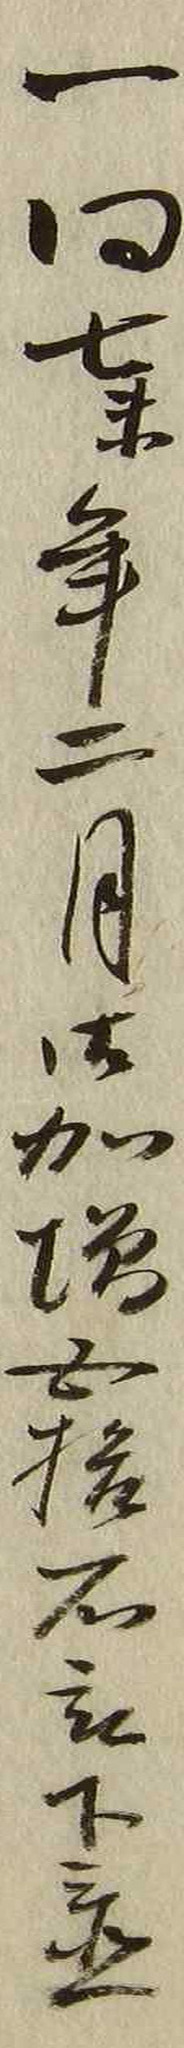一同七未年二月御加増五拾石被下置
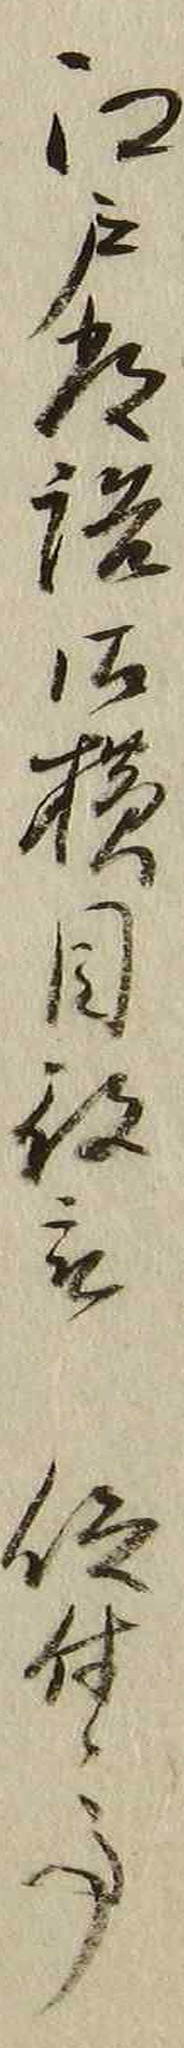江戸常詰御横目役被仰付候事
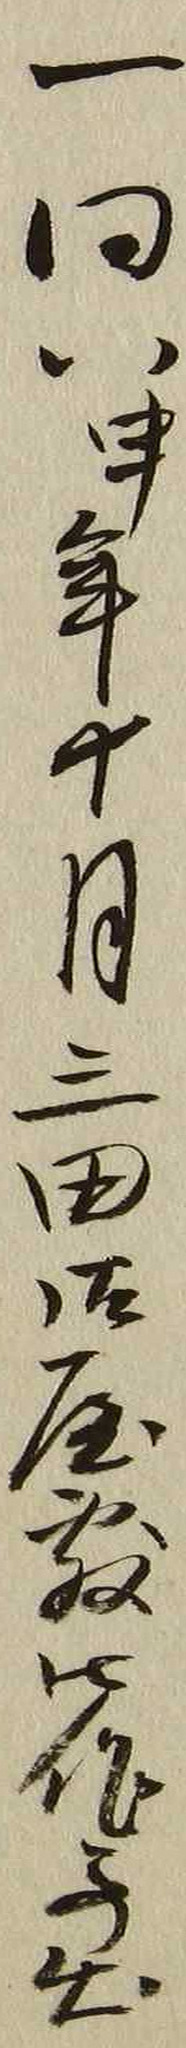一同八申年十月三田御屋敷御作事出
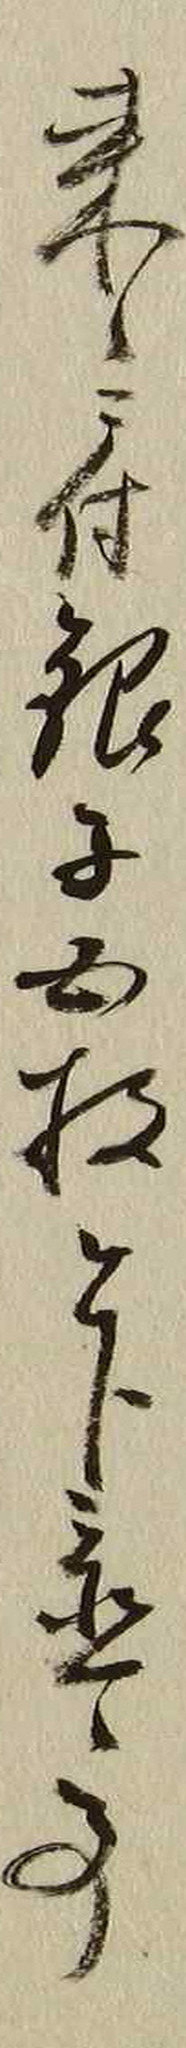来候ニ付銀子五枚被下置候事
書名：諸士系譜　巻之352　す之部2
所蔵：会津若松市立会津図書館
